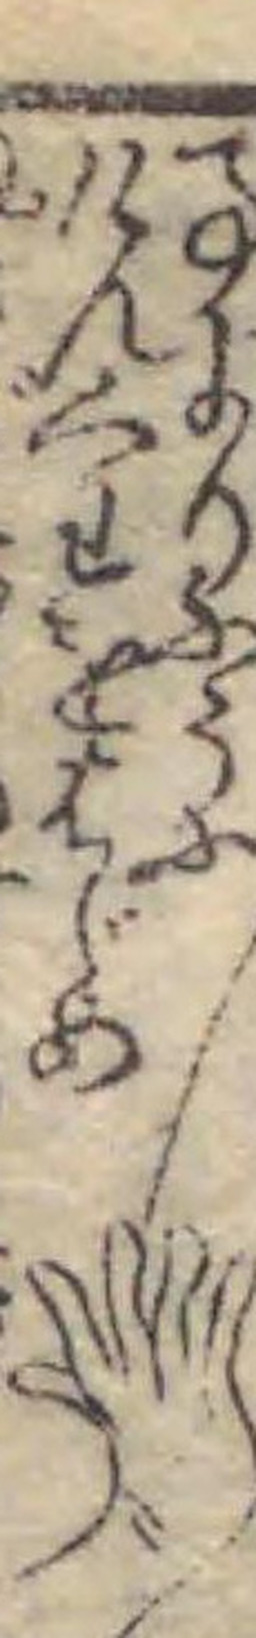けんくわをはじめ
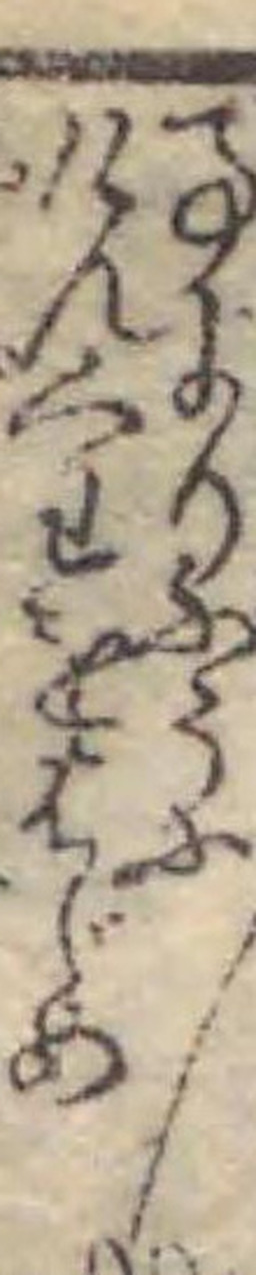けんくわをはじめ
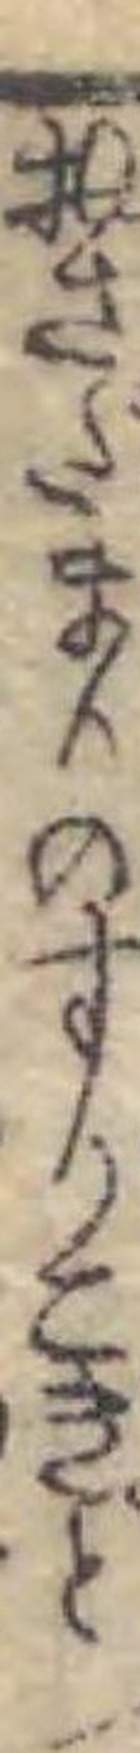おさだまりのすりこきと
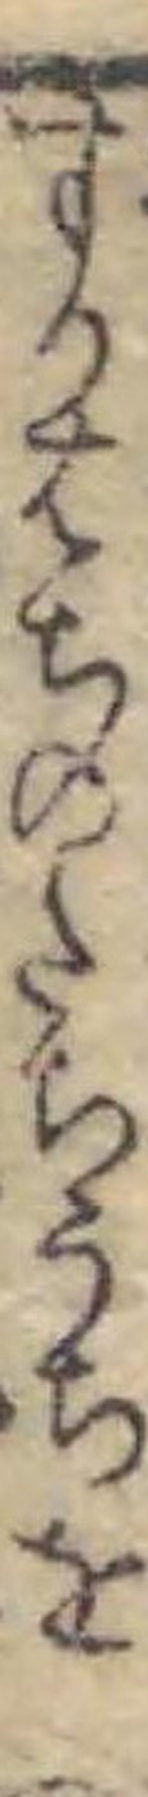すりはちのたちうちを
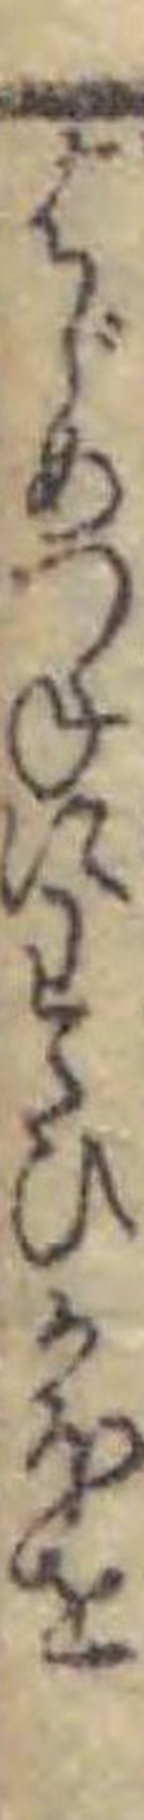はじめつねにわらひかほを
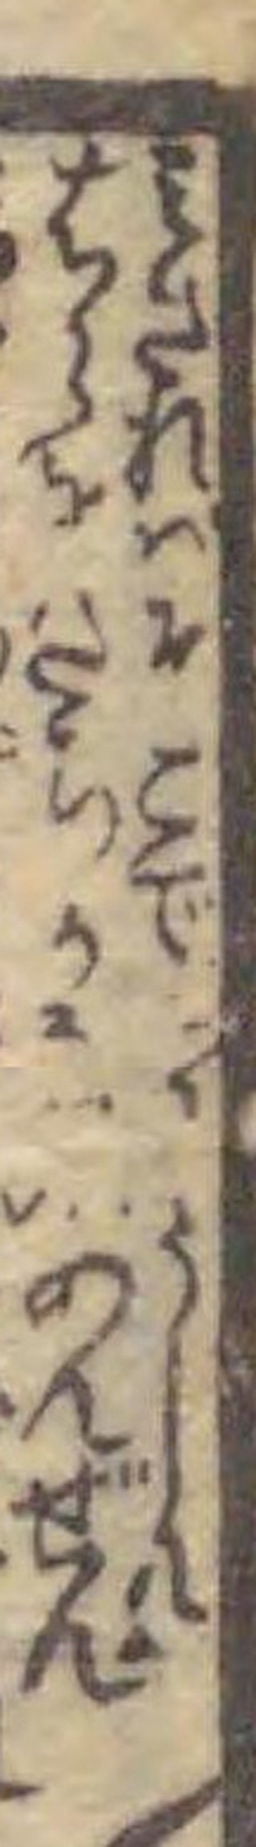はらをたちかなのんぜん
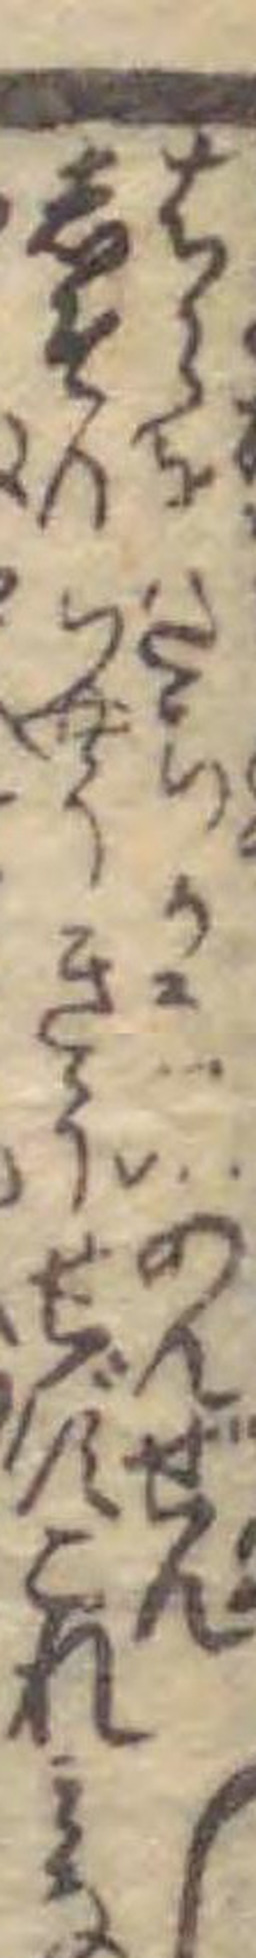しそやうきうせずこれみな
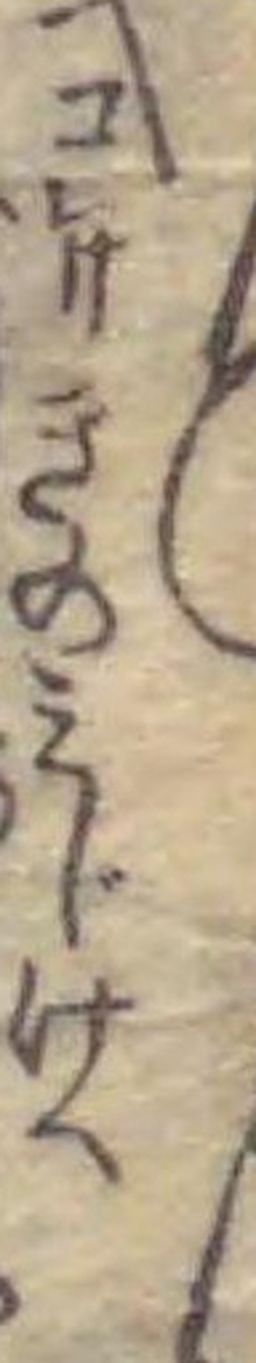〽コレサきのみじけへ
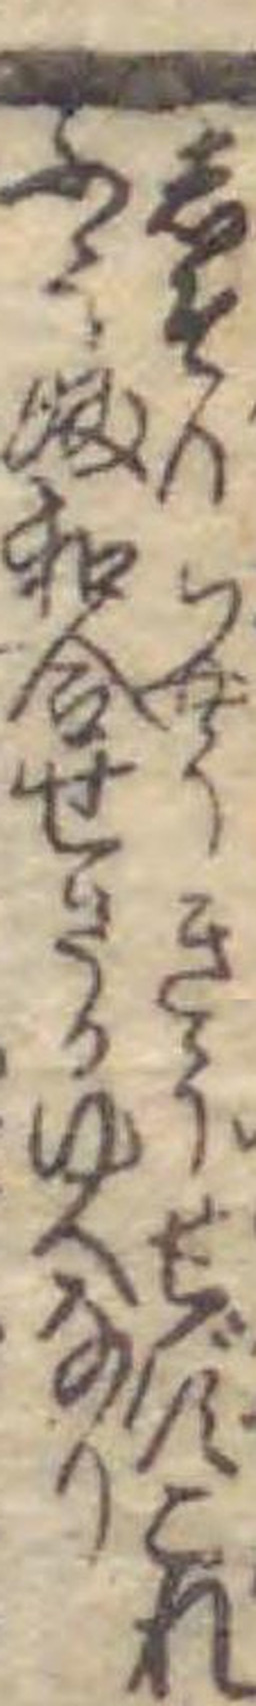ふうふ和合せさるゆへなり
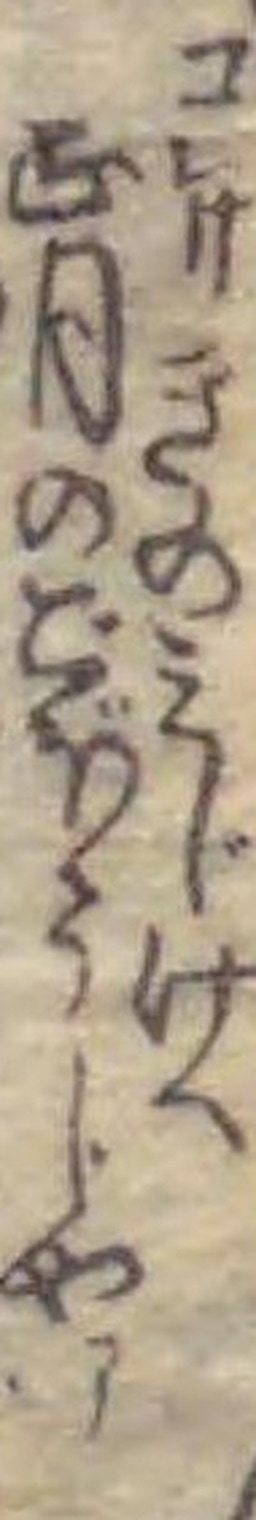正月のごぼうじやァ
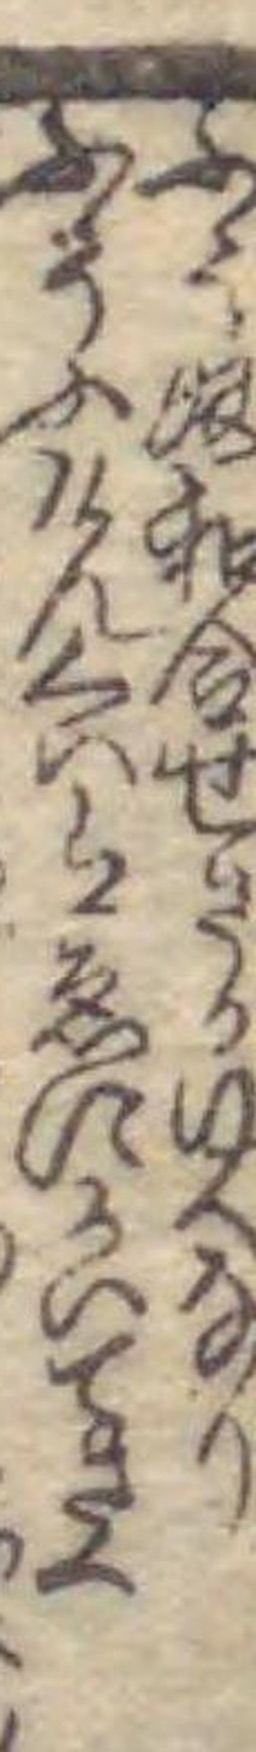ふうふけんくははゑにかいてさ
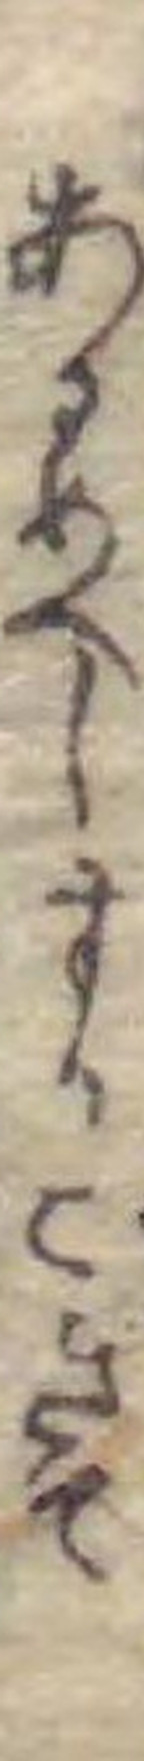あるめへしすりこぎて
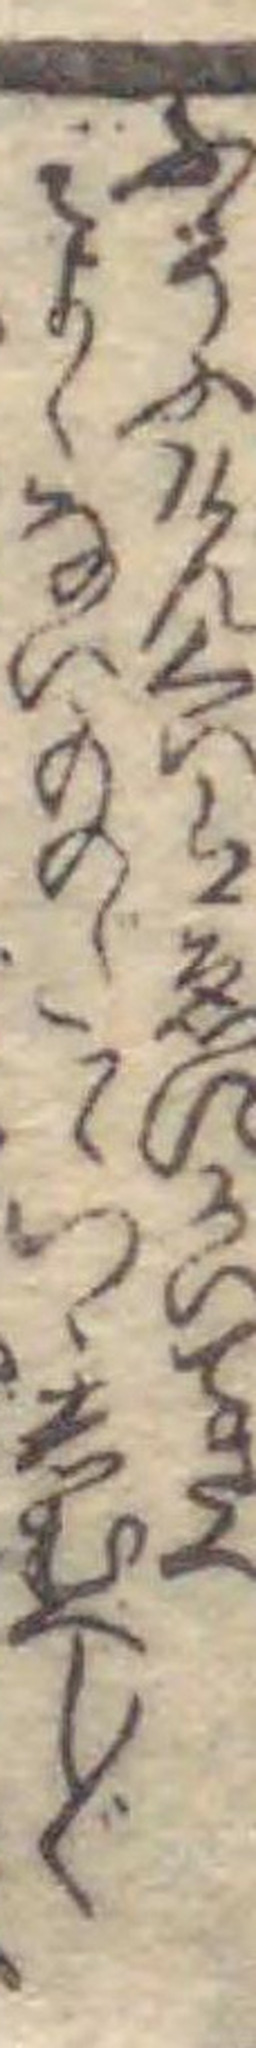よくないものだつゝしむべし〴〵
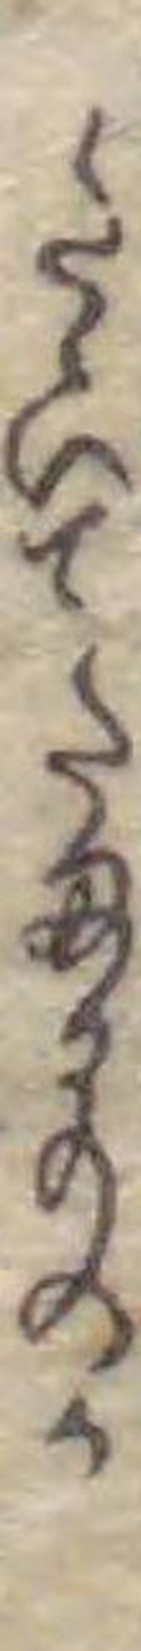たゝいてたまるものか
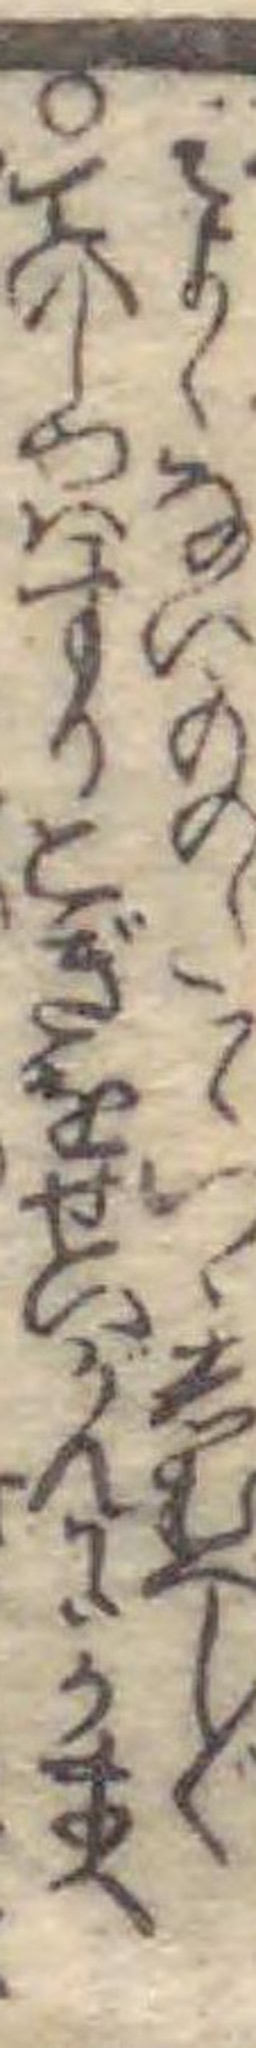○ていしゆはすりこぎをせいがんにかまへ
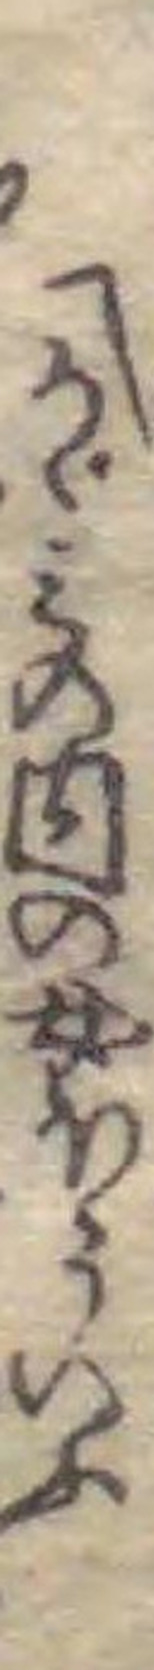〽かゞみの内の女ほういふ
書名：人心鏡写絵 : 3巻
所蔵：国立国会図書館 National Diet Library, JAPAN
